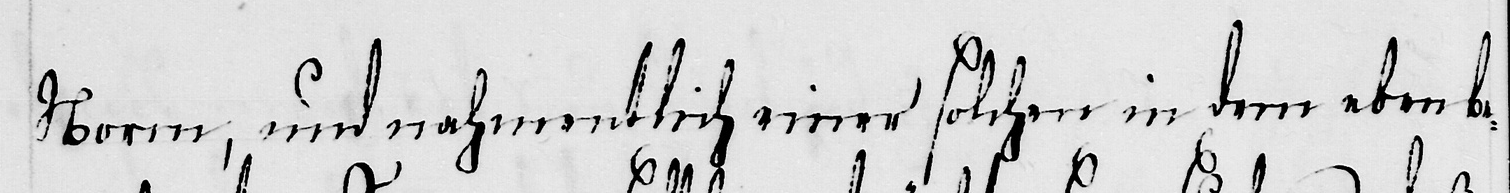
Norm, und nahmentlich einer solchen in dem eben b¬
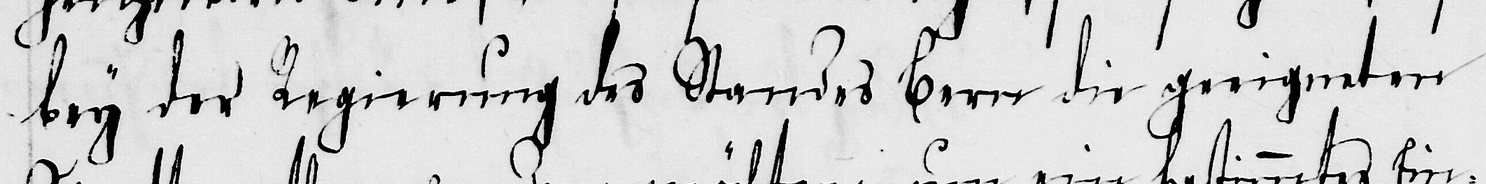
bey der Regierung des Standes Bern die geeigneten
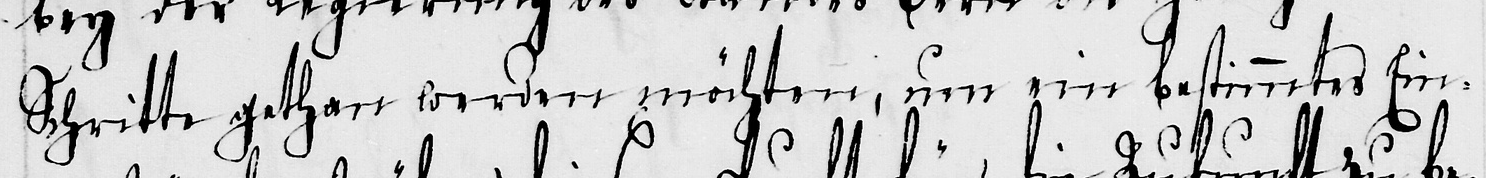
Schritte gethan werden möchten, um ein bestimmtes Ein¬
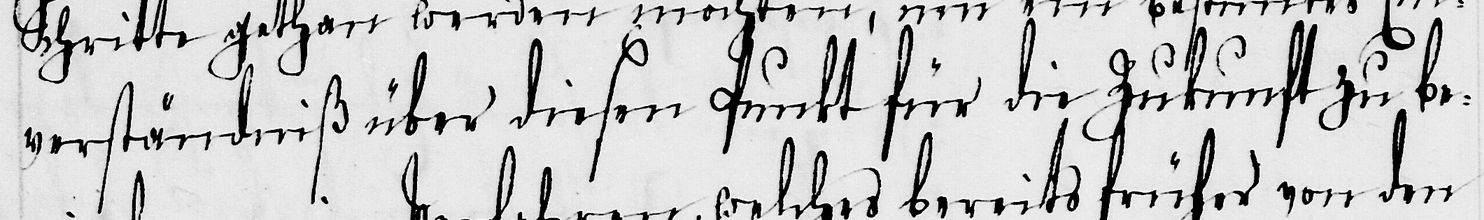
verständniß über diesen Punkt für die Zukunft zu be¬
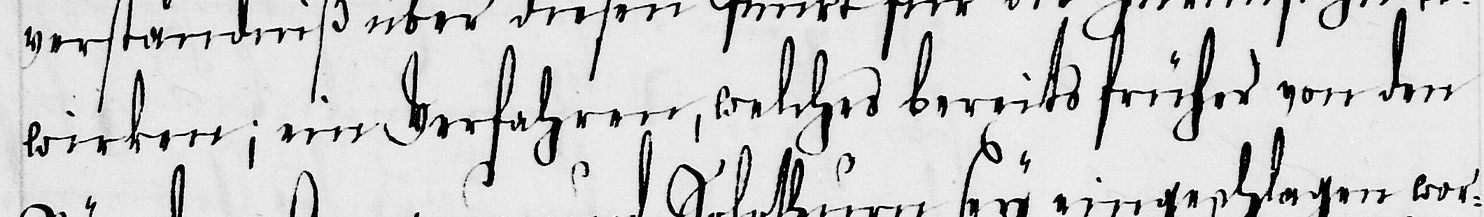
wirken; ein Verfahren, welches bereits früher von den
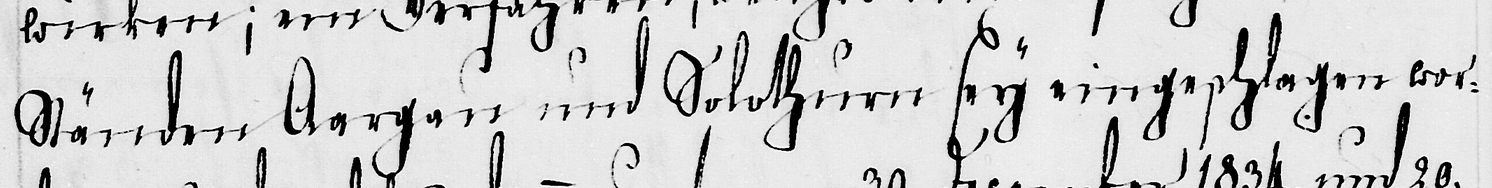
Ständen Aargau und Solothurn sey eingeschlagen wor¬
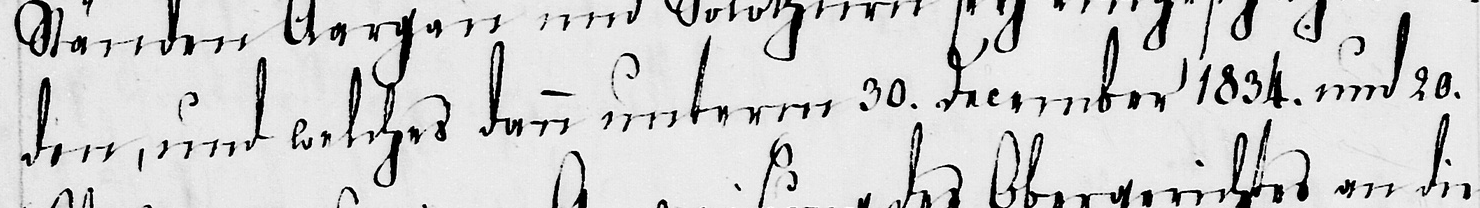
den, und welches dann unterm 30. December 1834. und 20.
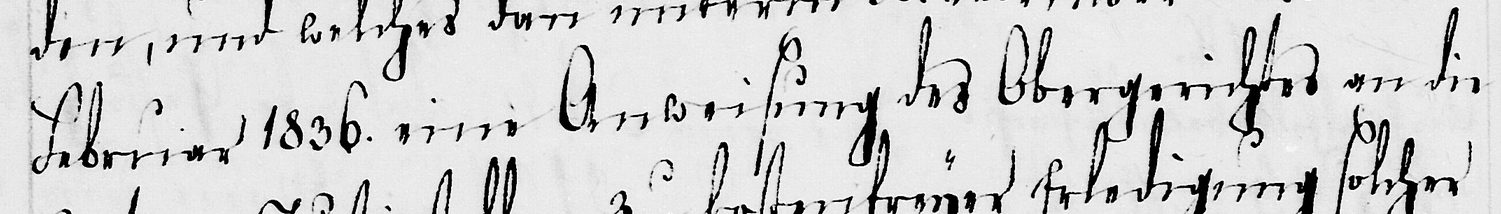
Februar 1836. eine Anweisung des Obergerichtes an die
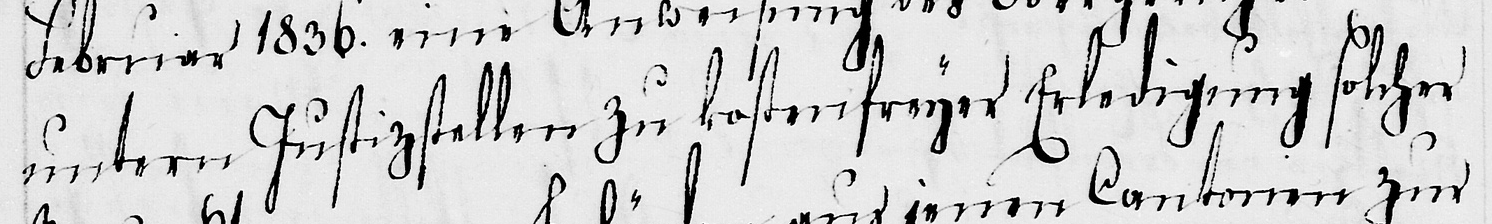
untern Justizstellen zu kostenfreyer Erledigung solcher
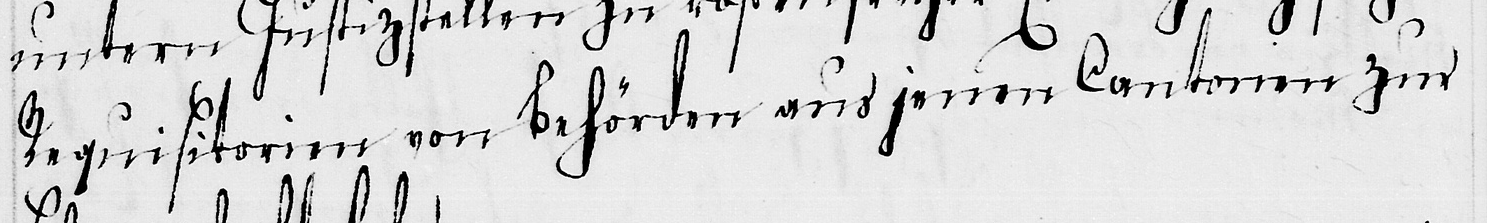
Requisitorien von Behörden aus jenen Cantonen zur
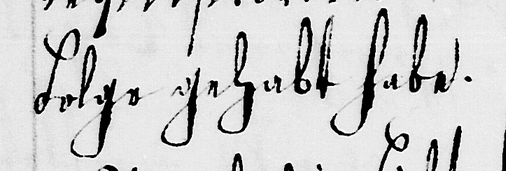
Folge gehabt habe.
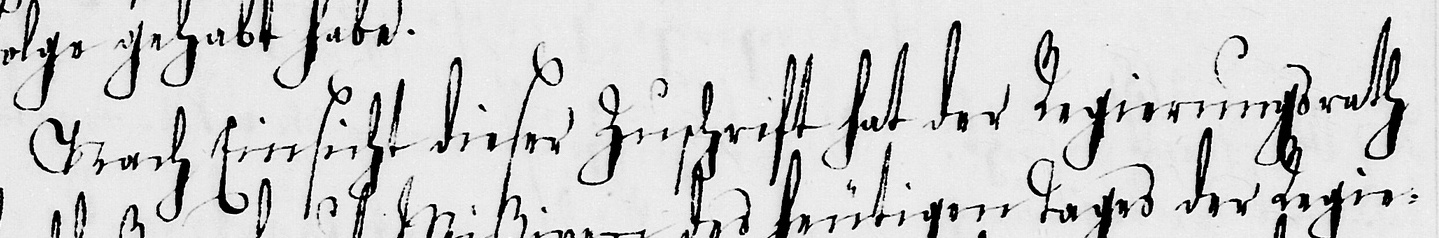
Nach Einsicht dieser Zuschrift hat der Regierungsrath
